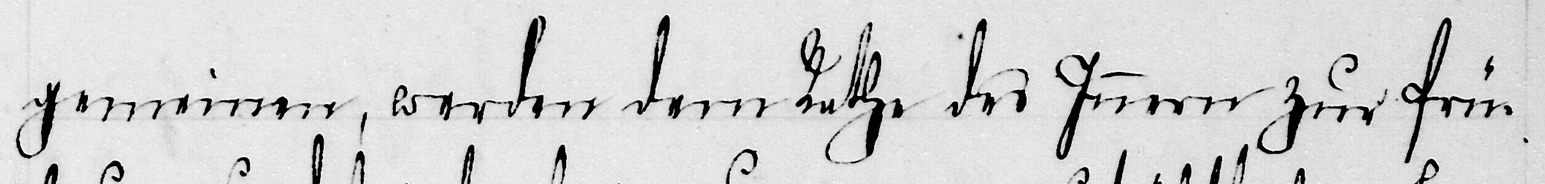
gemeinen, werden dem Rathe des Innern zur Prü¬
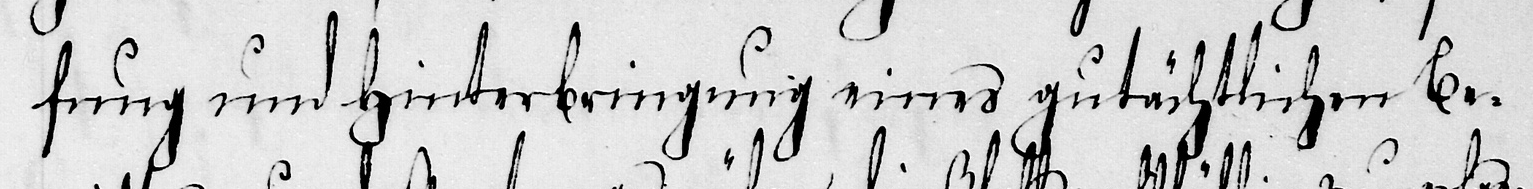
fung und Hinterbringung eines gutächtlichen Be¬
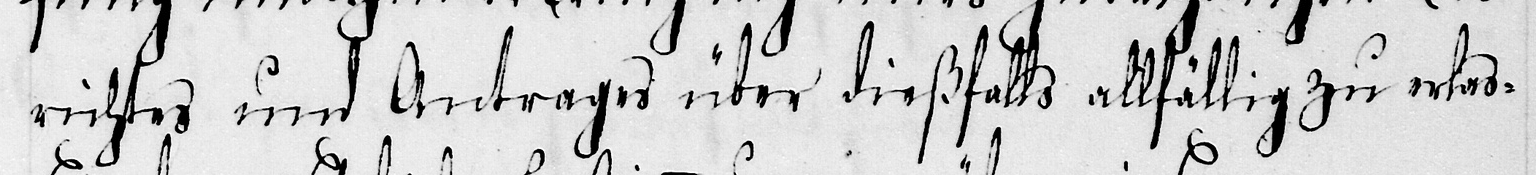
richtes und Antrages über dießfalls allfällig zu erlas¬
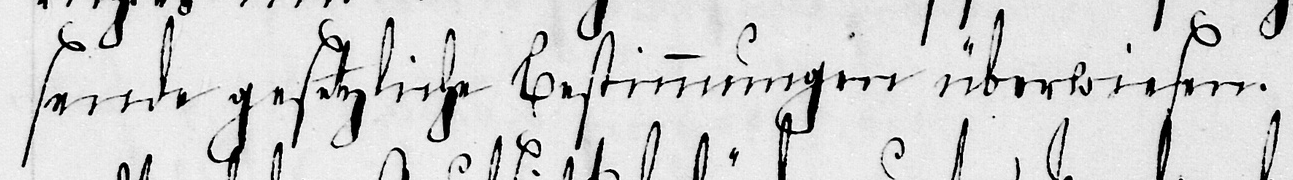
sende gesetzliche Bestimmungen überwiesen.
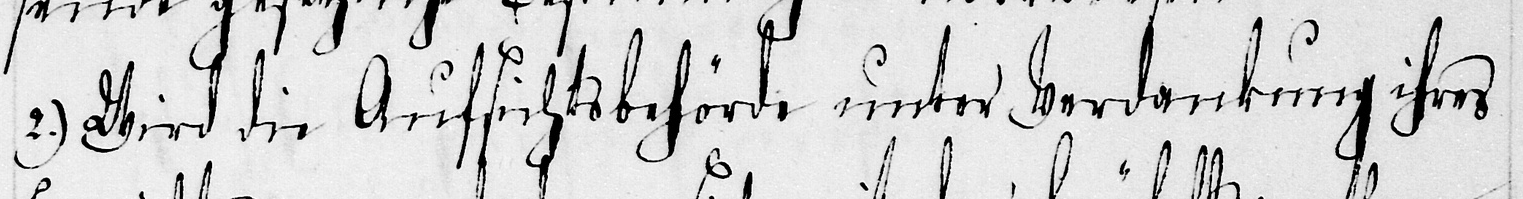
2.) Wird die Aufsichtsbehörde unter Verdankung ihres
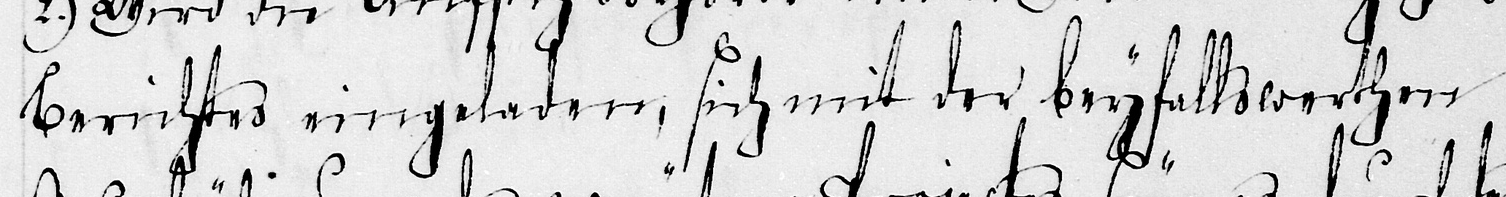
Berichtes eingeladen, sich mit der beyfallswerthen
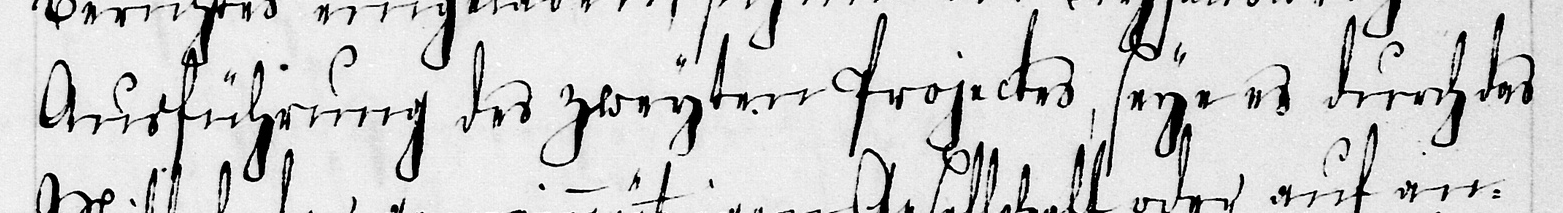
Ausführung des zweyten Projectes, seye es durch das
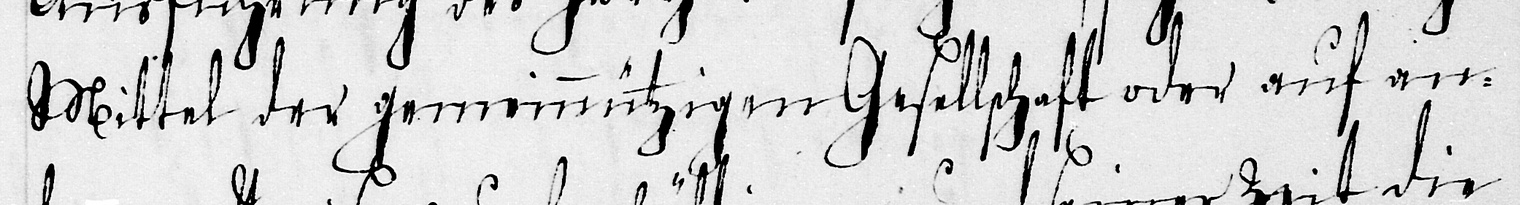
Mittel der gemeinnützigen Gesellschaft oder auf an¬
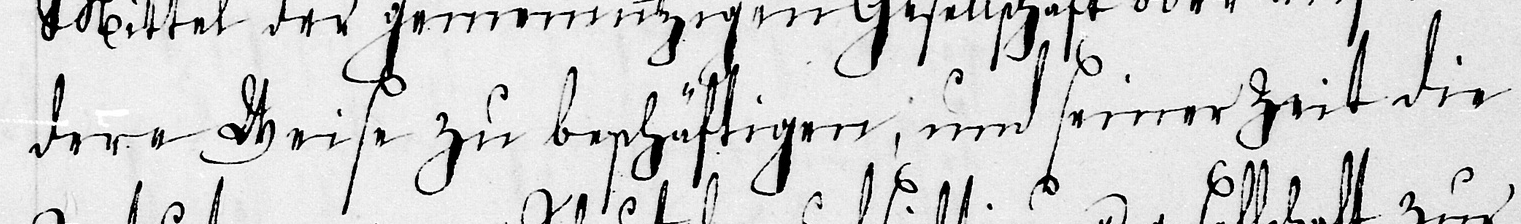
dere Weise zu beschäftigen, und seiner Zeit die
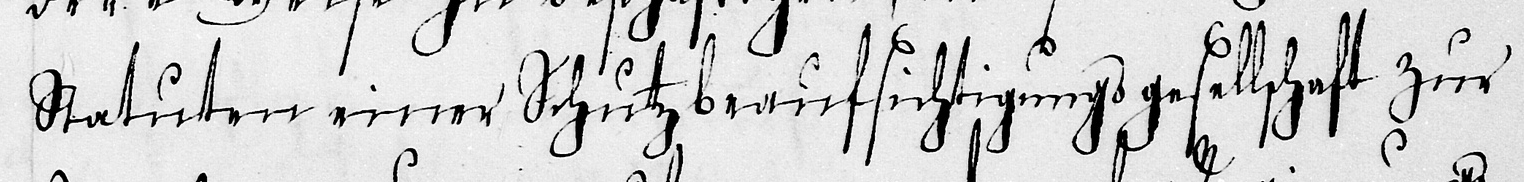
Statuten einer Schutzbeaufsichtigungsgesellschaft zur
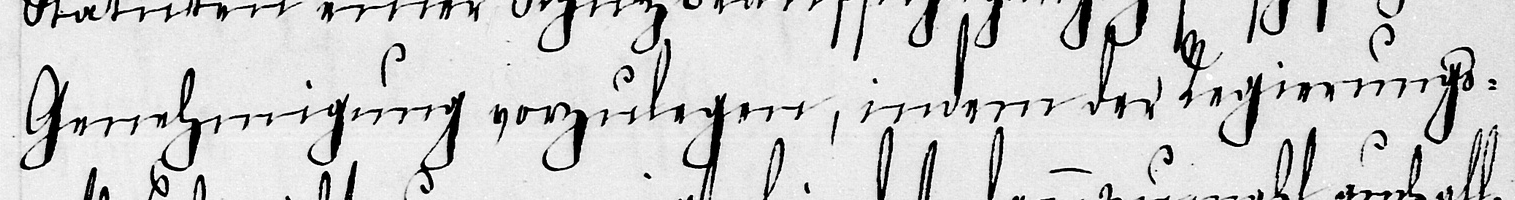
Genehmigung vorzulegen, indem der Regierungs¬
